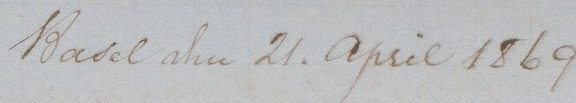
Basel den 21. April 1869
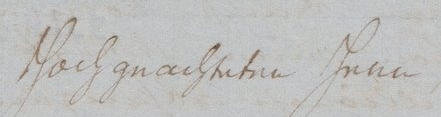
Hochgeachteter Herr,
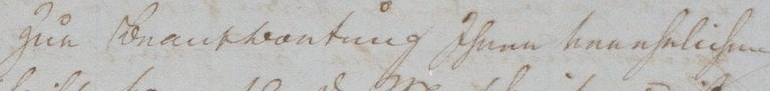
Zur Beantwortung Ihrer verehrlichen
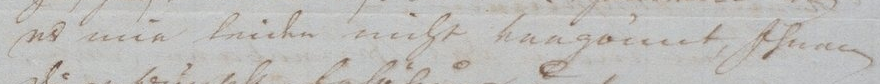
es mir leider nicht vergönnt, Ihnen
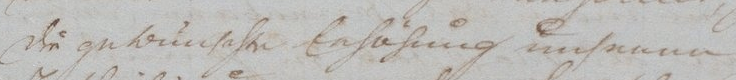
die gewünschte Erhöhung unserer
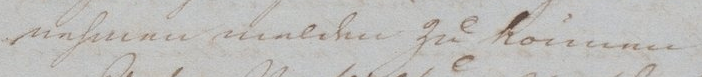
nehmen melden zu können.
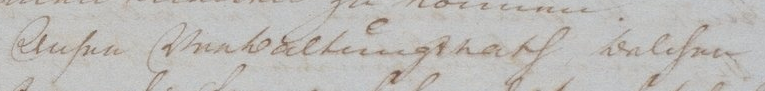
Unser Verwaltungsrath, welcher
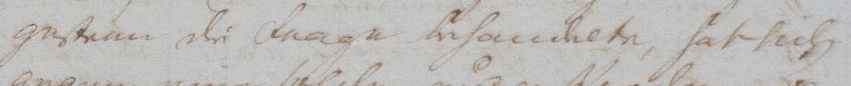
gestern die Frage behandelte, hat sich
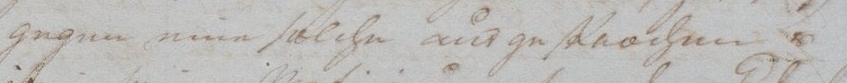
gegen eine solche ausgesprochen &
